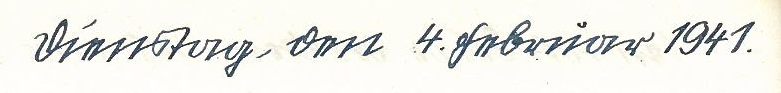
Dienstag, den 4. Februar 1941.
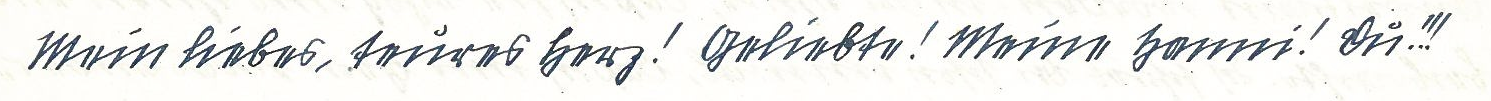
Mein liebes, teures Herz! Geliebte! Meine! Du!!!
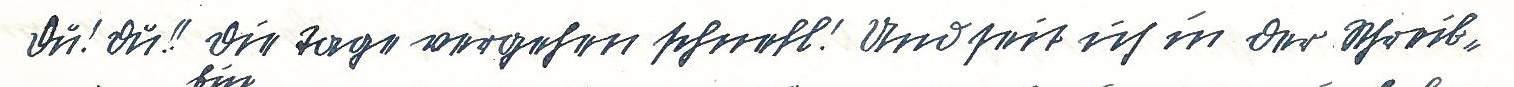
Du! Du!! Die Tage vergehen schnell! Und seit ich in der Schreib¬
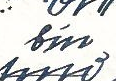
bin
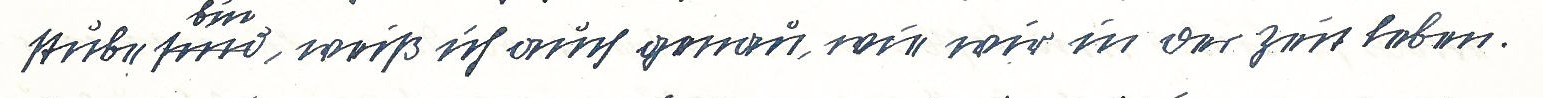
stube sind, weiß ich auch genau, wie wir in der Zeit leben.
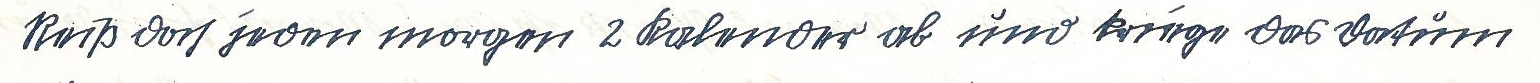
Reiß doch jeden Morgen 2 Kalender ab und kriege das Datum
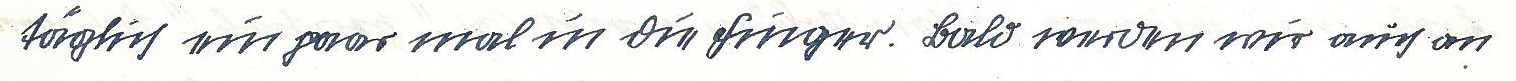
täglich ein paar mal in die Finger. Bald werden wir auch an
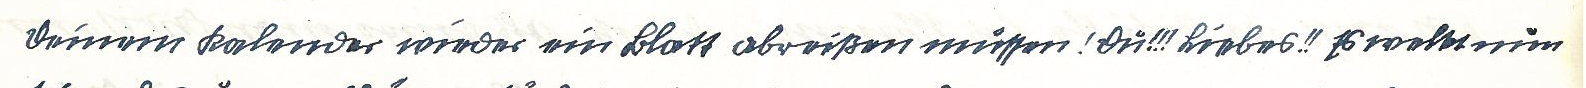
Deinem Kalender wieder ein Blatt abreißen müssen! Du!!! Liebes!!! Es welkt nun
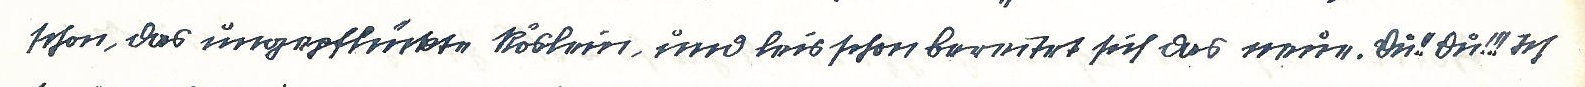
schon, das ungepflückte Röslein, und leis schon bereitet sich das neue. Du!! Du!!! Ich
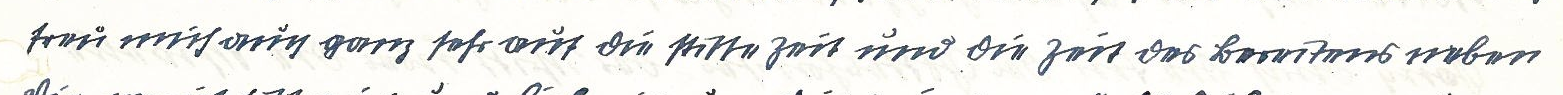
freu mich auch ganz sehr auf die stille Zeit und die Zeit des Bereitens neben
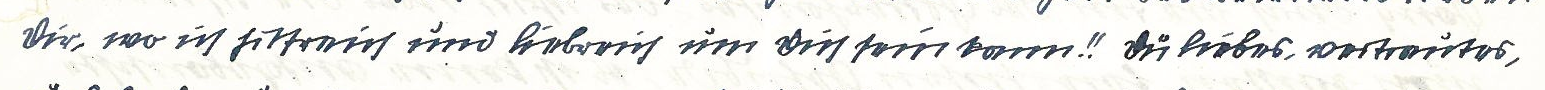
Dir, wo ich hilfreich und liebreich um Dich sein kann!! Du liebes, vertrautes,
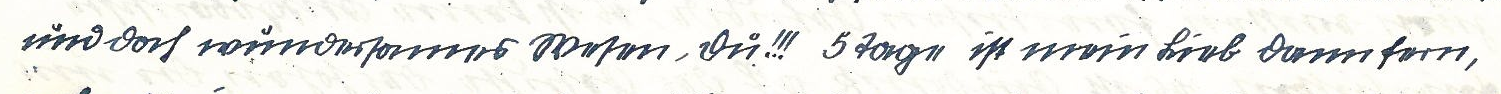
und doch wundersames Wesen, Du!!! 5 Tage ist mein Lieb dann fern,
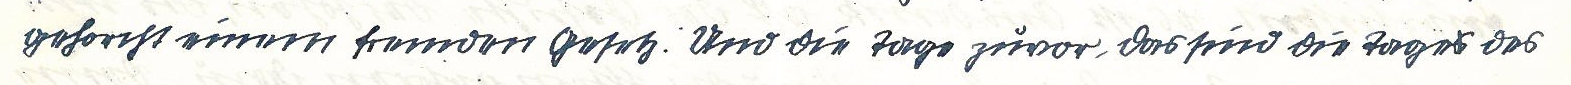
gehorcht einem fremden Gesetz. Und die Tage zuvor, das sind die Tage des
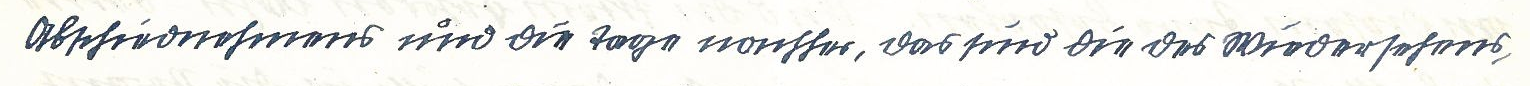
Abschiednehmens und die Tage nachher, das sind die des Wiedersehens,
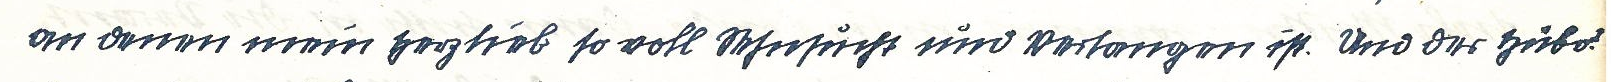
an denen mein Herzlieb so voll Sehnen und Verlangen ist. Und der Hubo,
